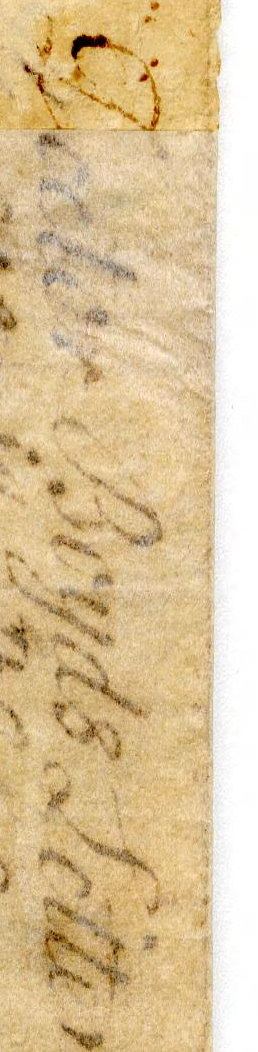Doctor Boyds Letter
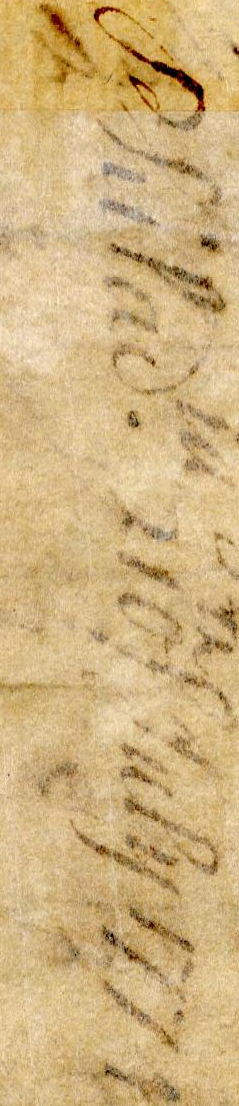Philad.^ia 21^th of July 1774
